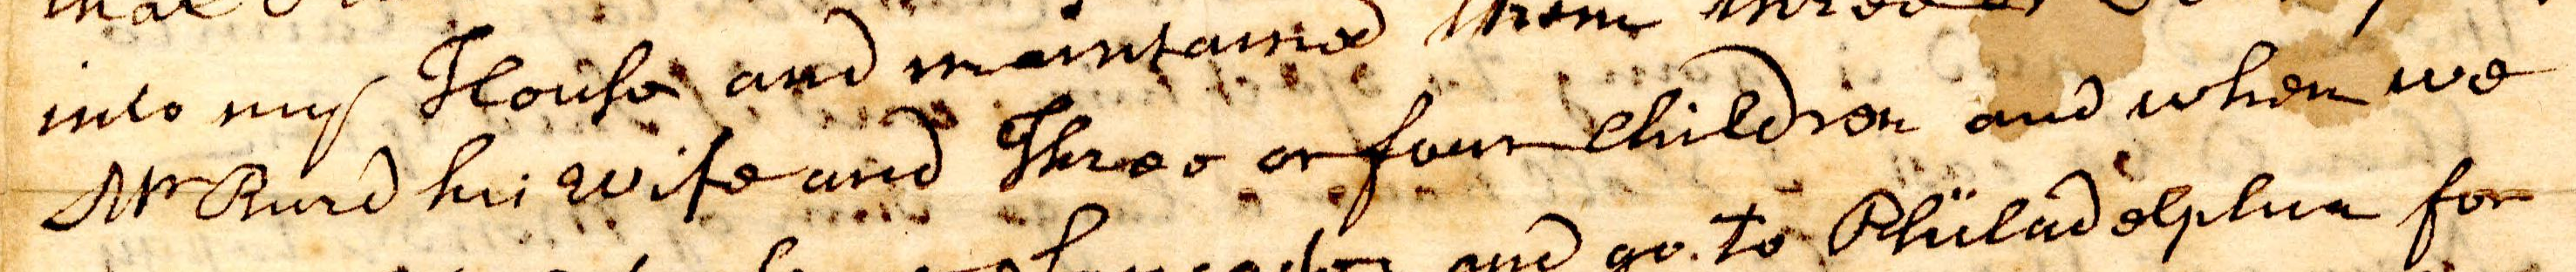M^r Burd his wife and Three or four children and when we
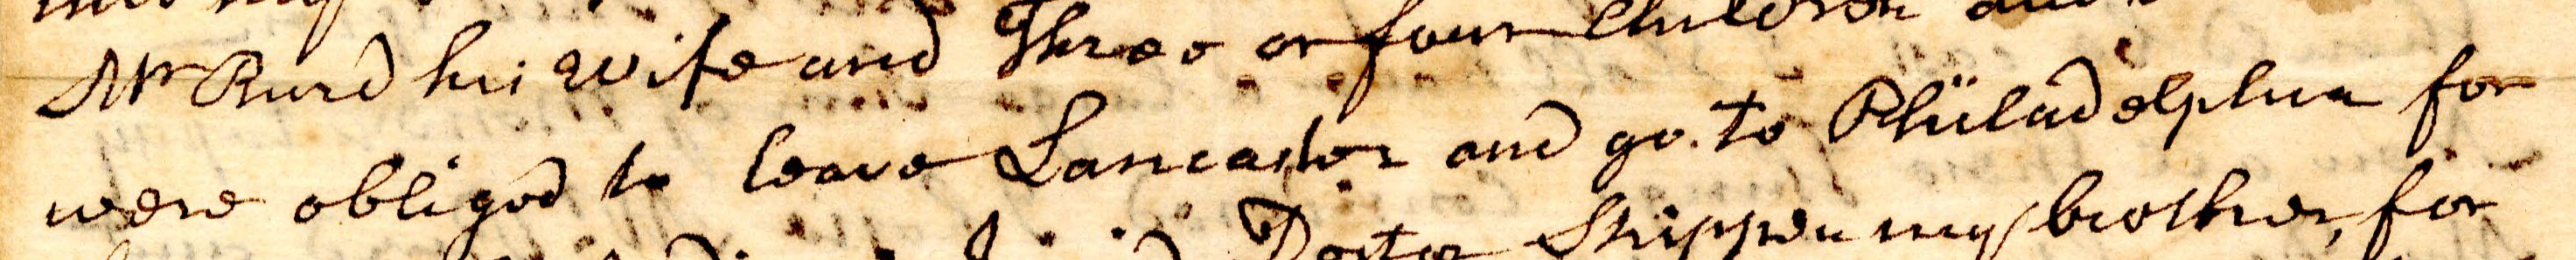were obliged to leave Lancaster and go to Philadelphia for
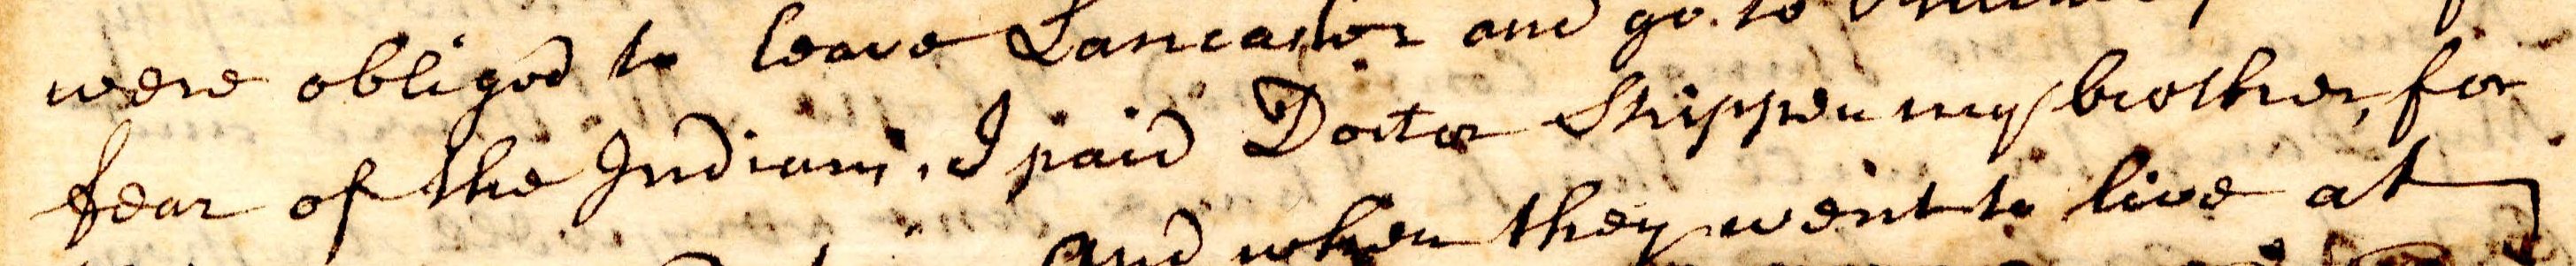fear of the Indians, I paid Doctor Shippen my brother, for
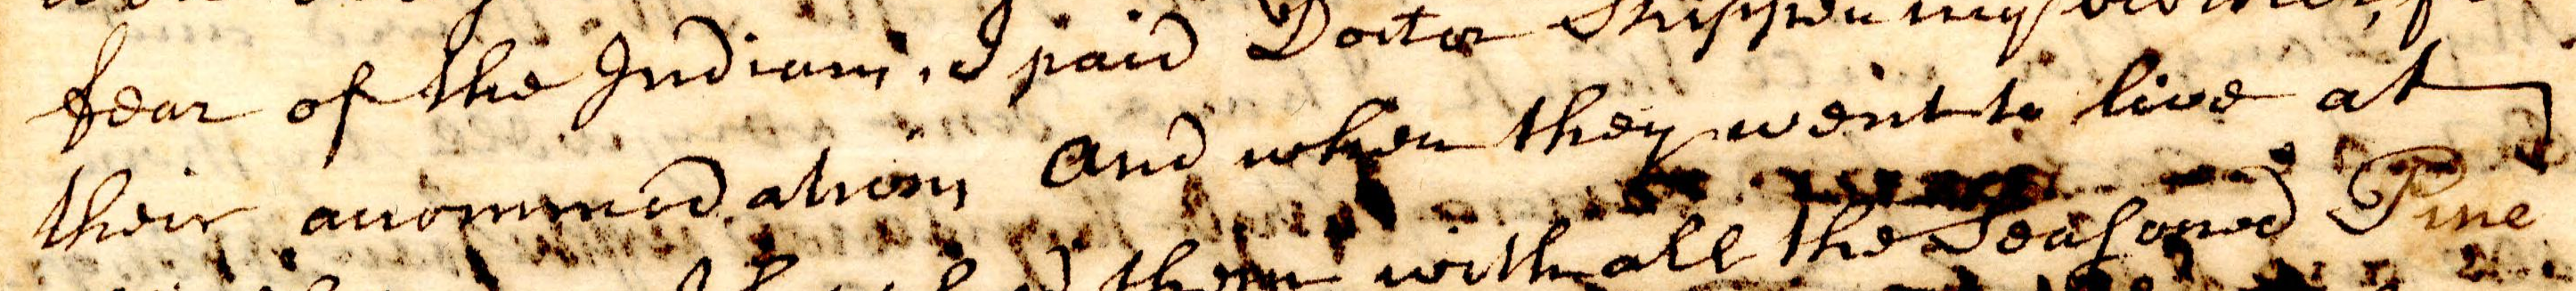their accommodations And when they went to live at
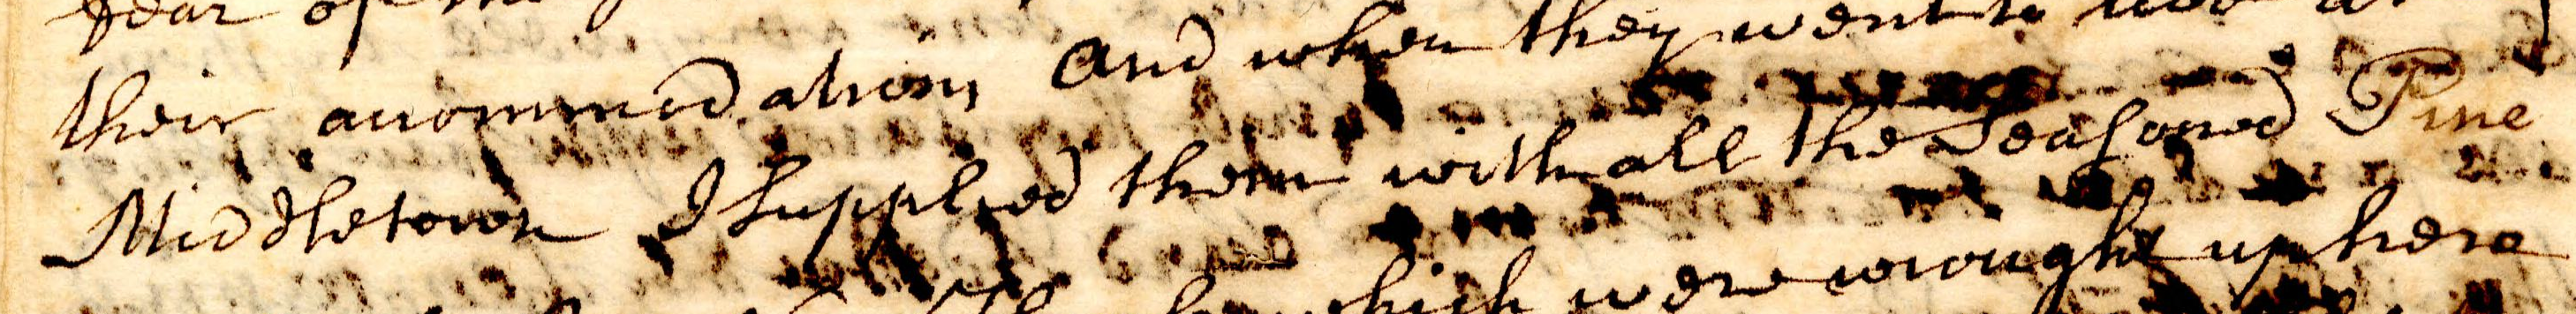Middletown I supplied them with all the seasoned Pine
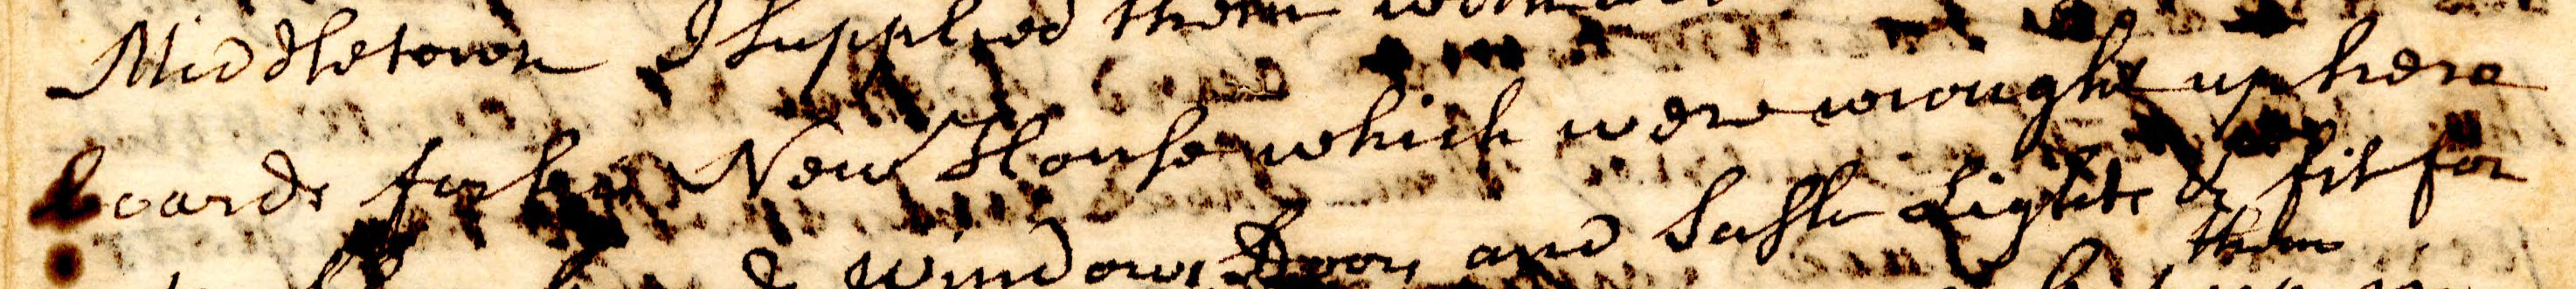[b]oards for [their] New House which were wrought up here
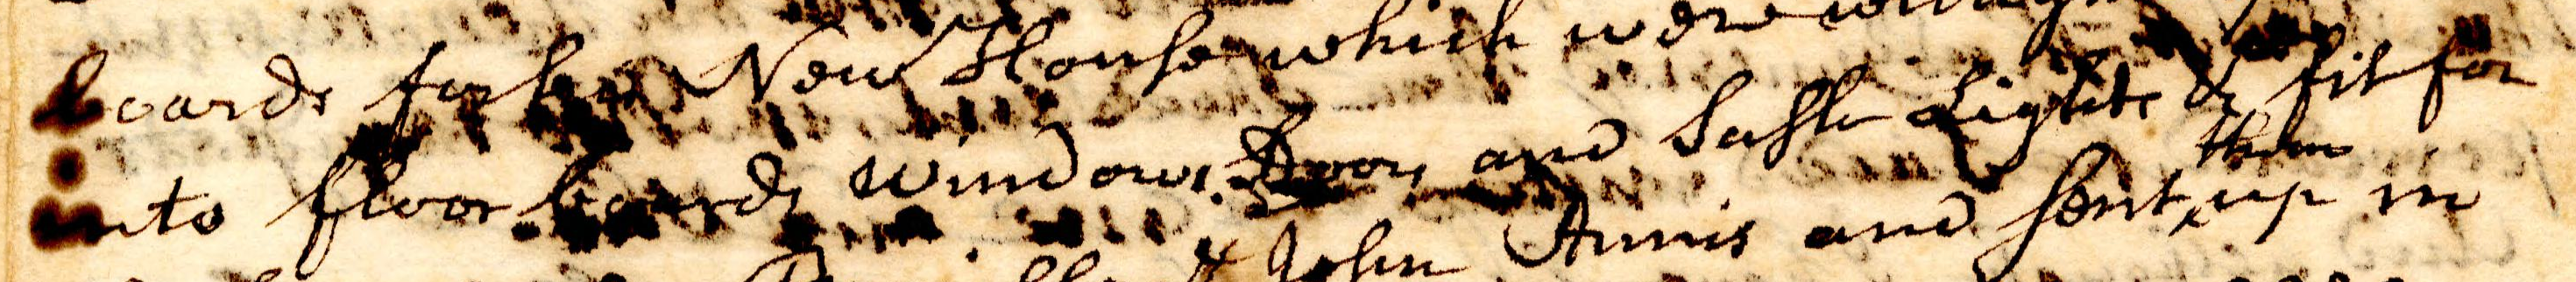into floor boards windows Doors and [suffic] Lights & fit for
